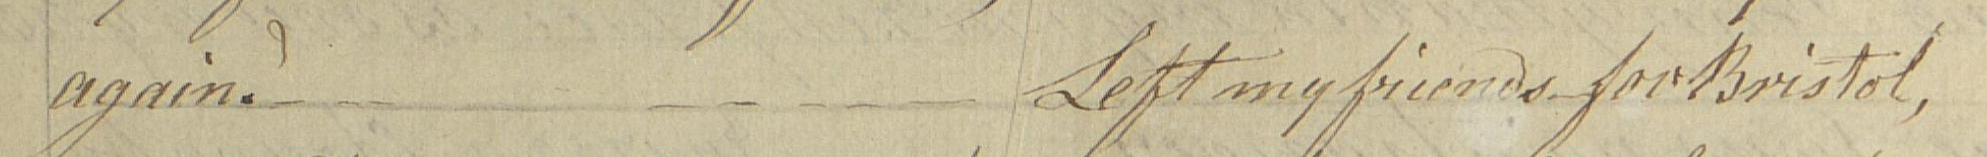again. Left my friends for Bristol,
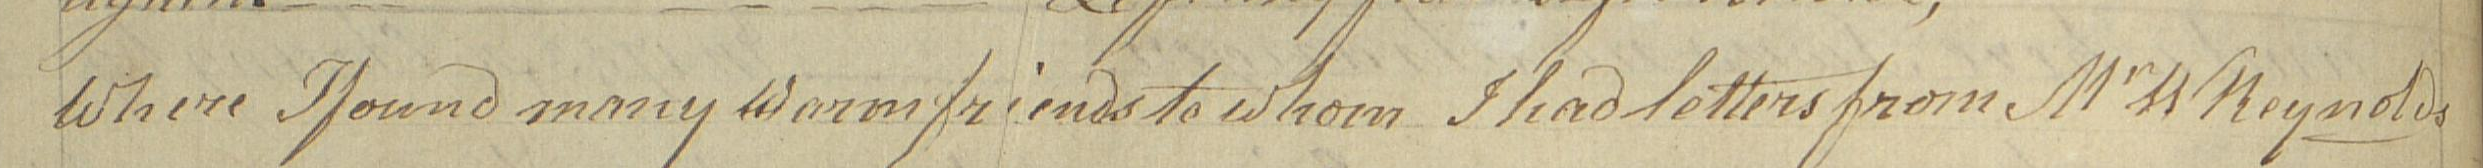where I found many Warm friends to whom I had letters from M^r. M Reynolds
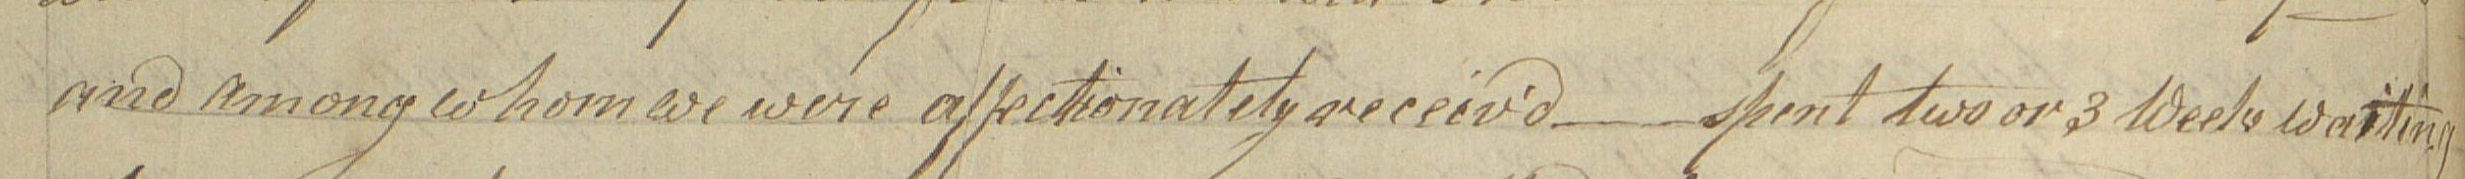and among whom we were affectionately receiv'd spent two or 3 Weeks Waiting
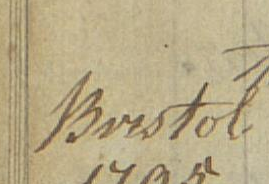Bristol
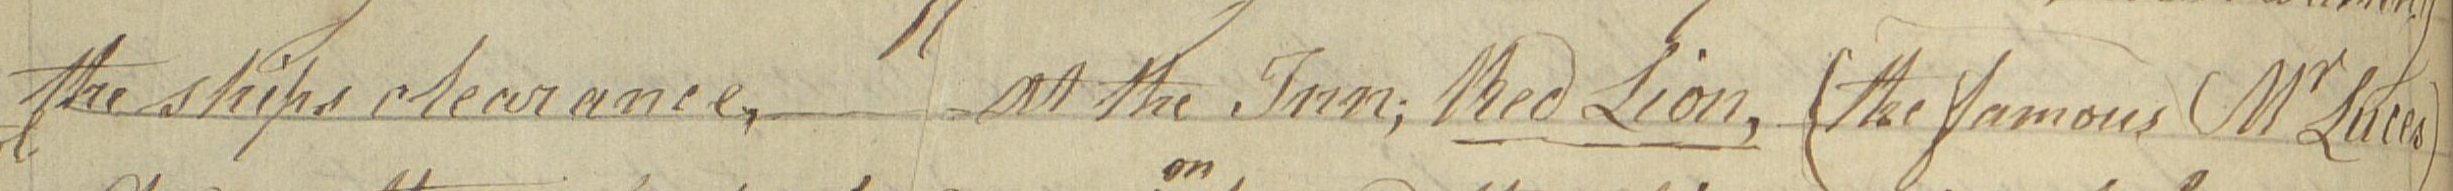the ships clearance, At the Inn, Red Lion, (the famous M^r. Luces)
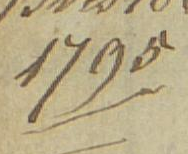1795
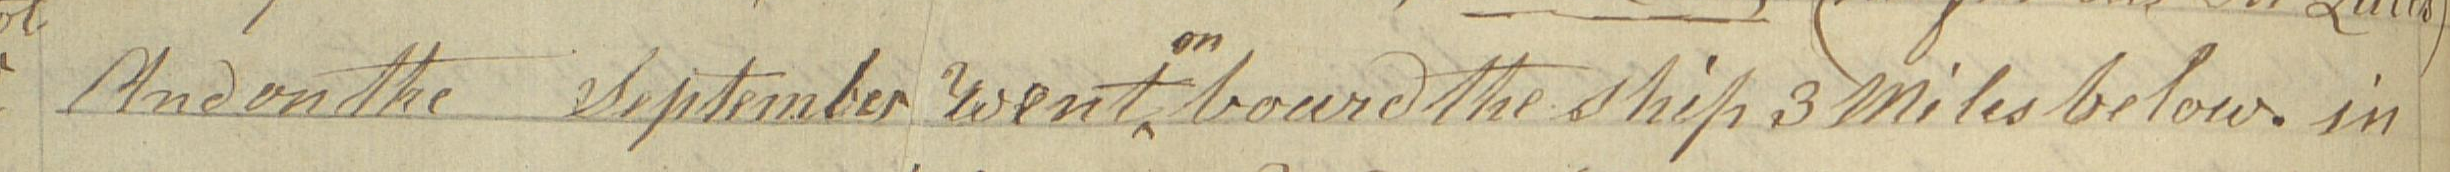And on the September went ^ board the ship 3 Miles below in
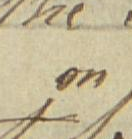on
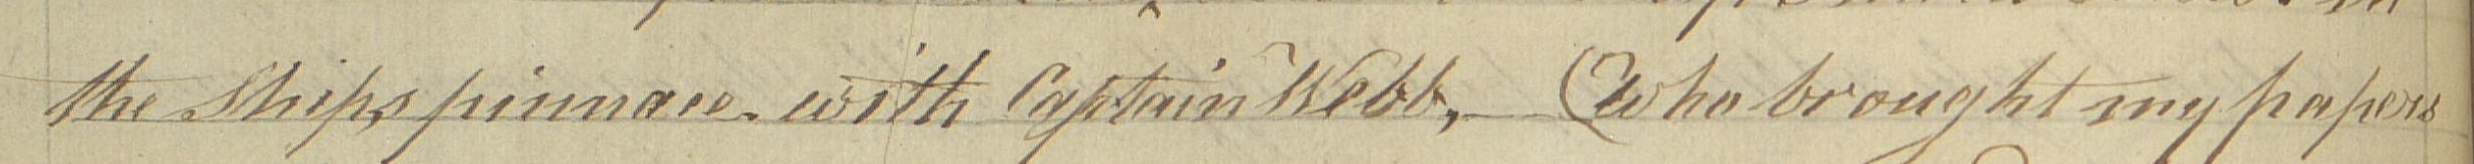the ships pinnace with Captain Webb, (Who brought my papers
